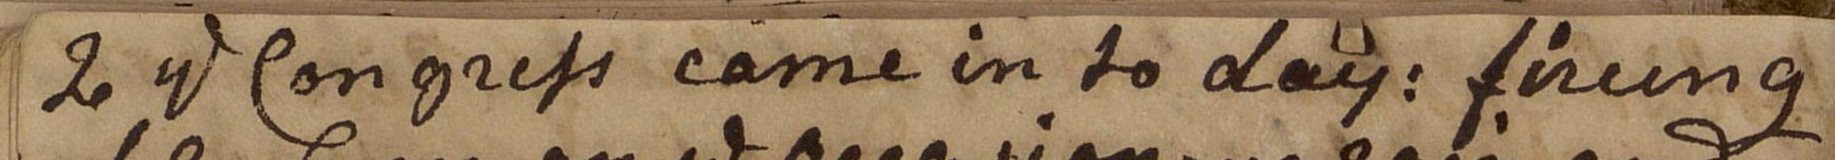2 y^e Congress came in to day: fireing
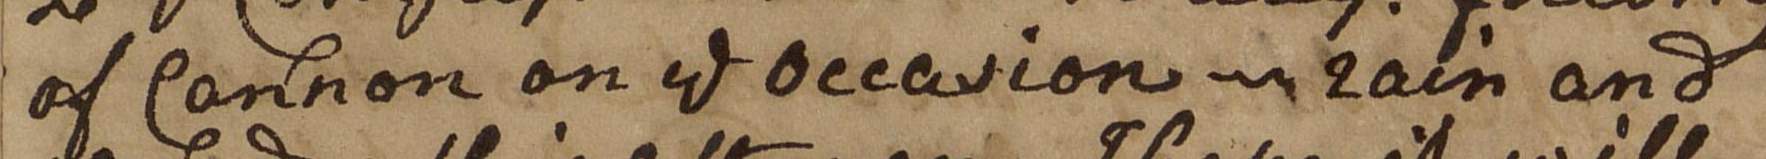of Cannon on y^e occasion- rain and
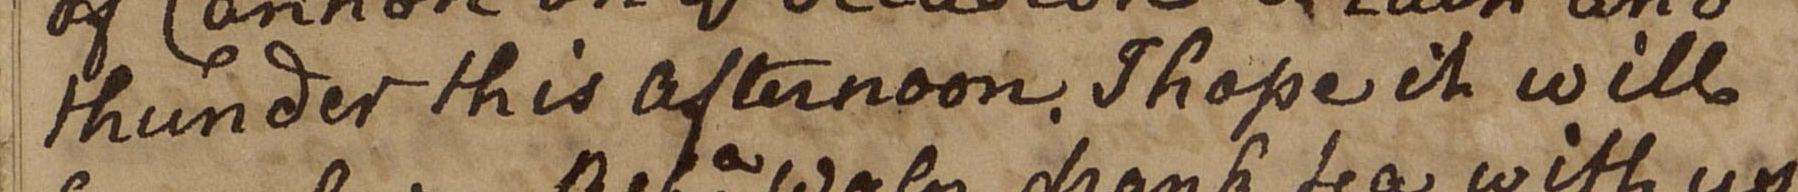thunder this afternoon. I hope it will
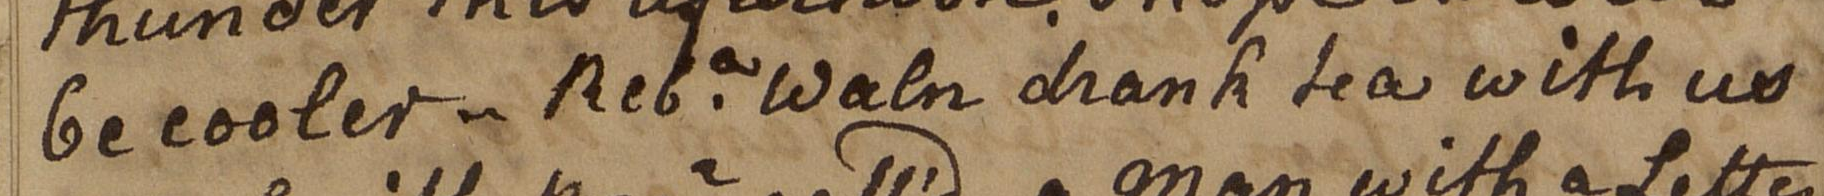be cooler- Reb^a. Waln drank tea with us
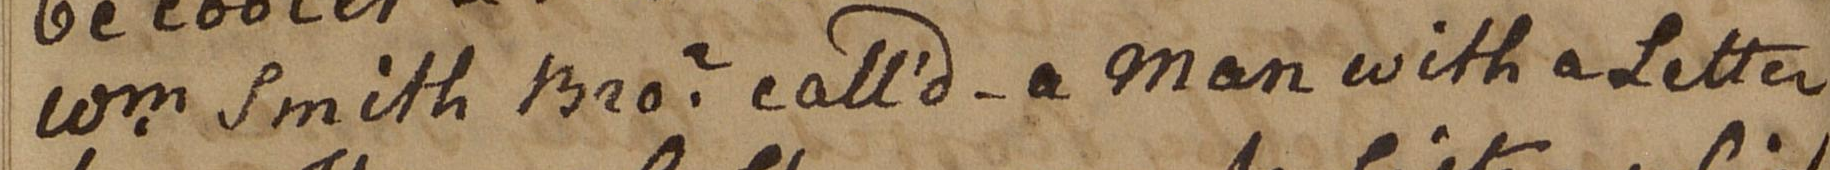W^m. Smith Bro^r. call'd- a man with a Letter
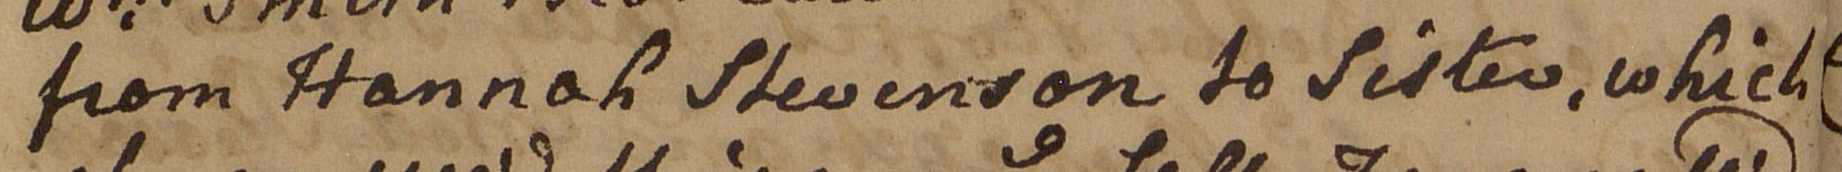from Hannah Stevenson to Sister, which
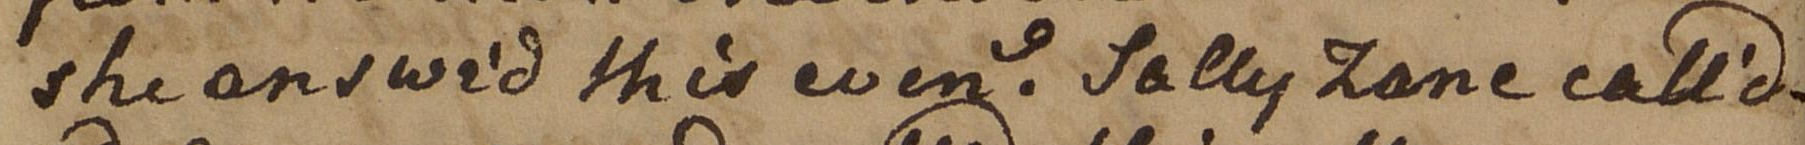she answr'd this even^g. Sally Zane call'd
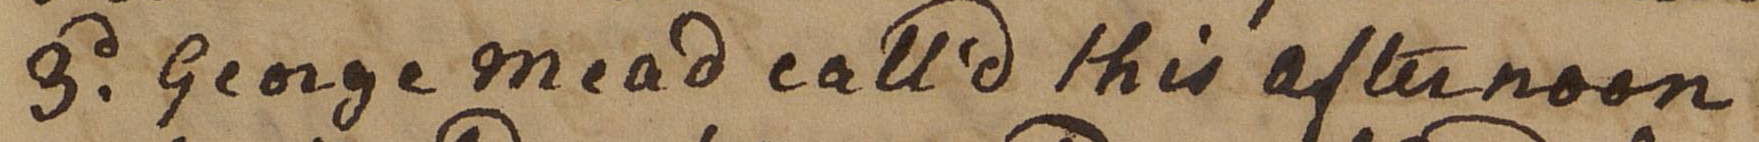3^d. George Mead call'd this afternoon
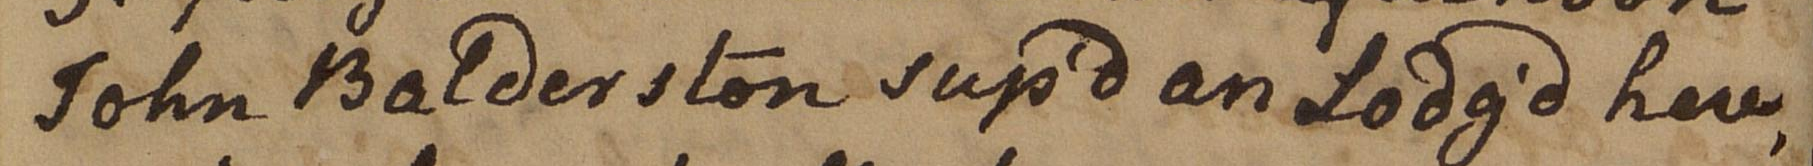John Balderston sup'd an Lodg'd here,
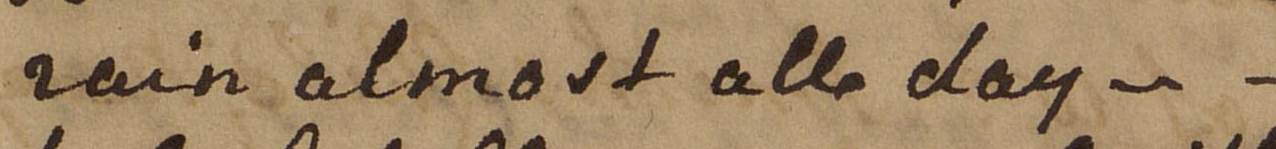rain almost all day-
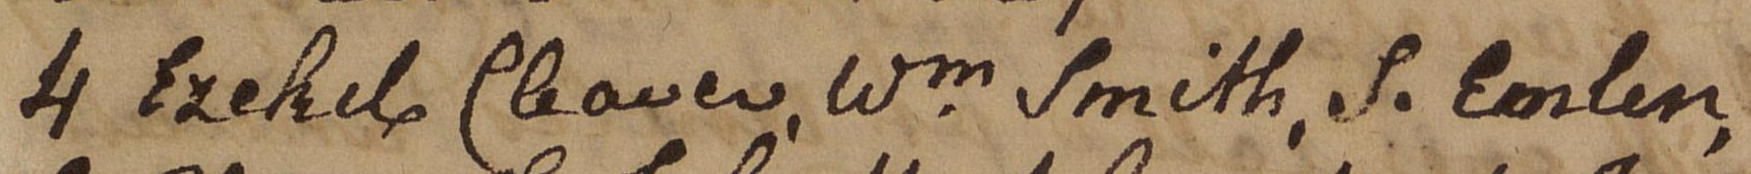4 Ezekel Cleaver, W^m. Smith, S. Emlen,
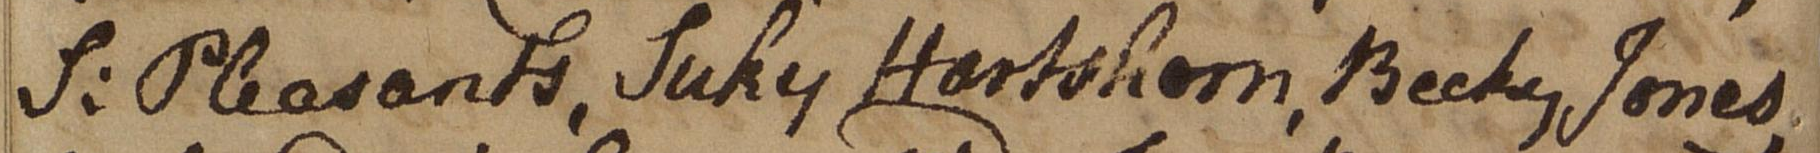S: Pleasants, Suky Hartshorn, Becky Jones,
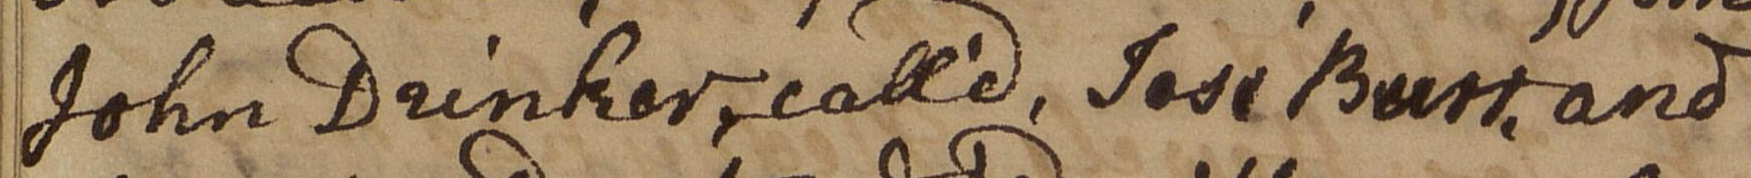John Drinker, call'd, Jos: Burt, and
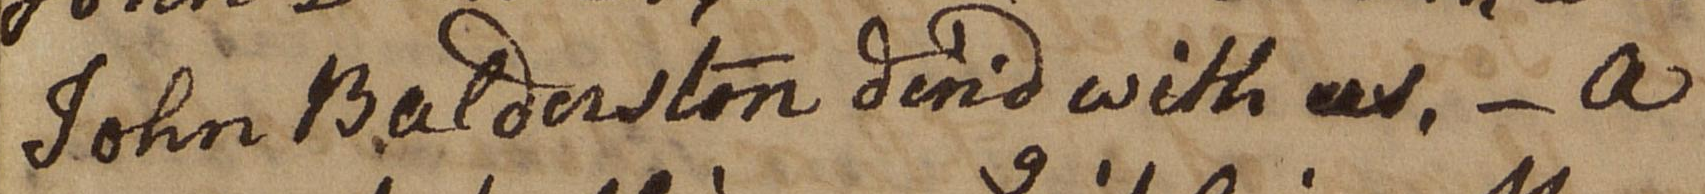John Balderston din'd with us,- a
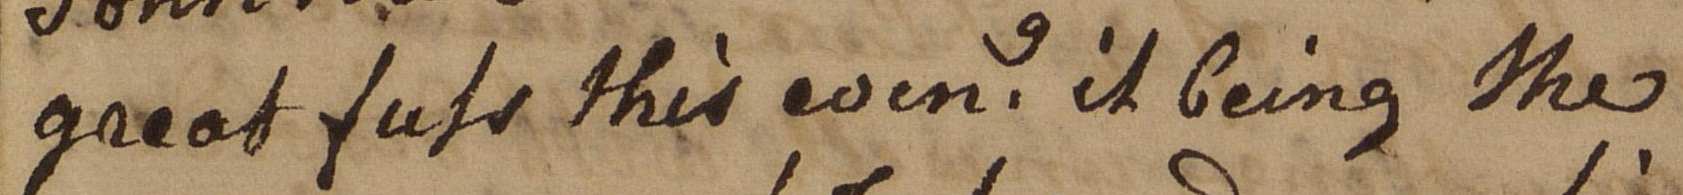great fuss this even^g. it being the
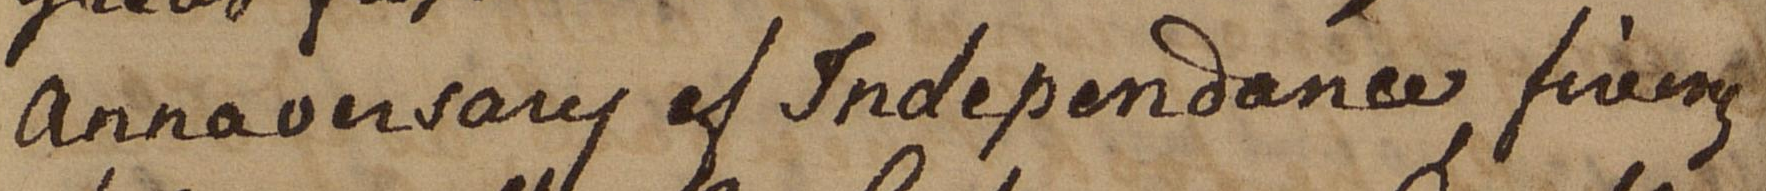Annaversary of Independance firing
